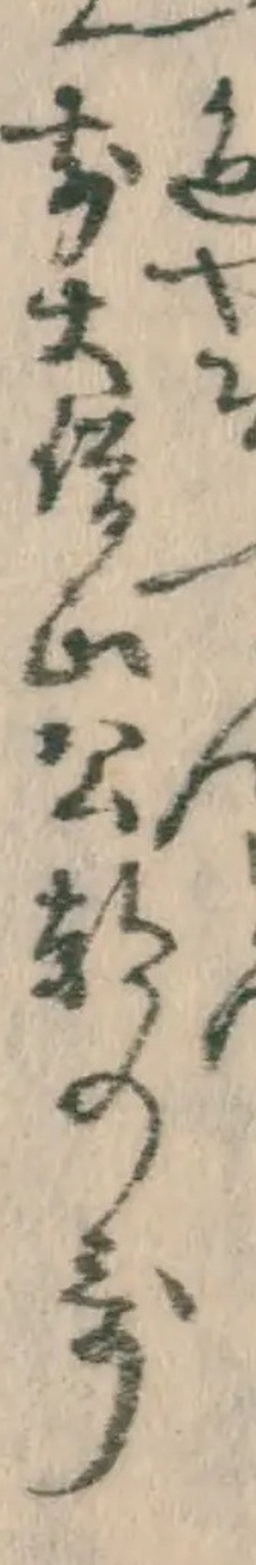前大僧正公朝の歌
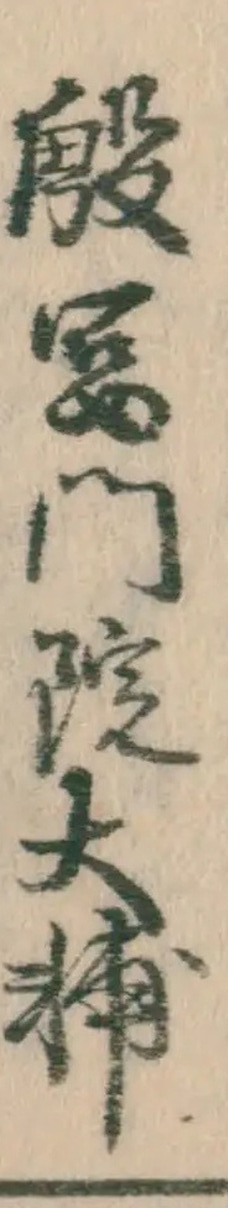殷富門院大輔
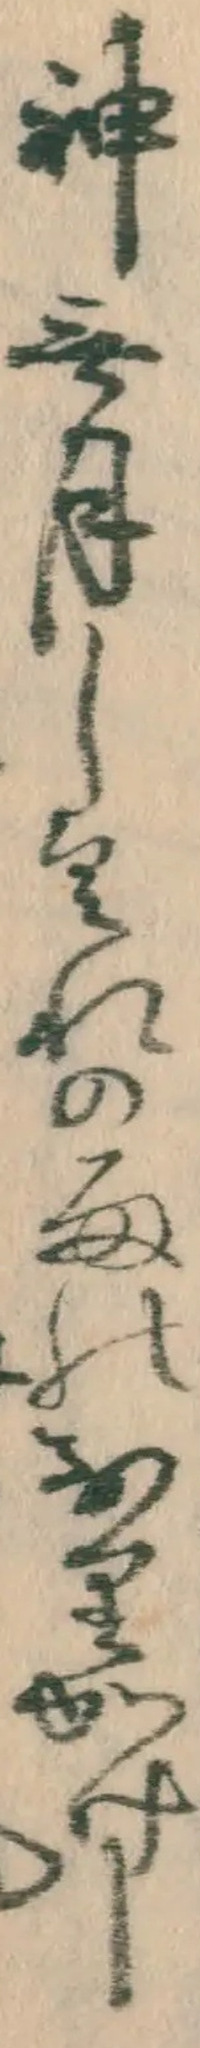神無月しくれの雨のおりかけし
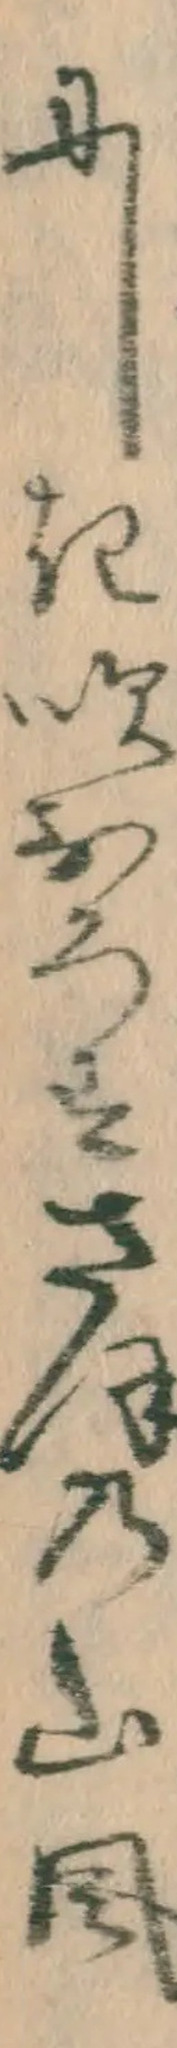にしき吹おろすさほの山風

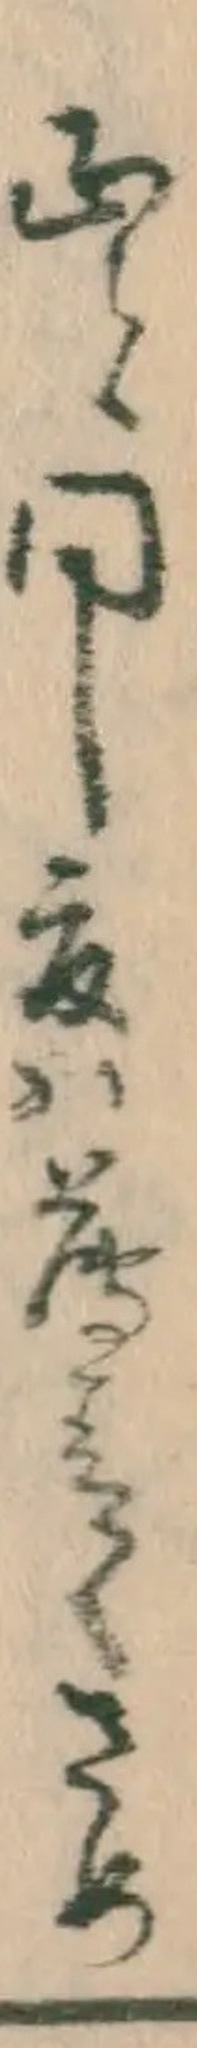山と同し夏は薄青くさめ
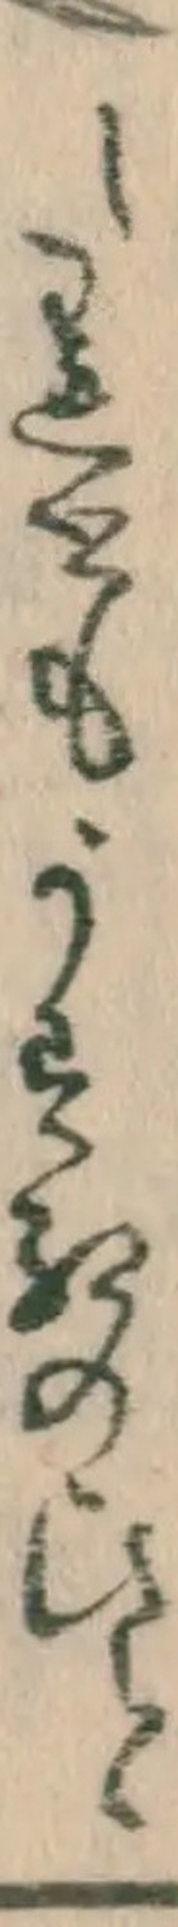たれともうす紅のひと
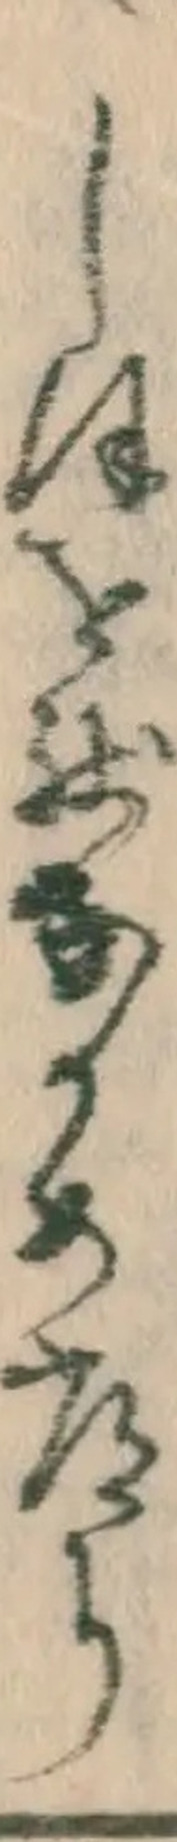しほを残なかめ常に
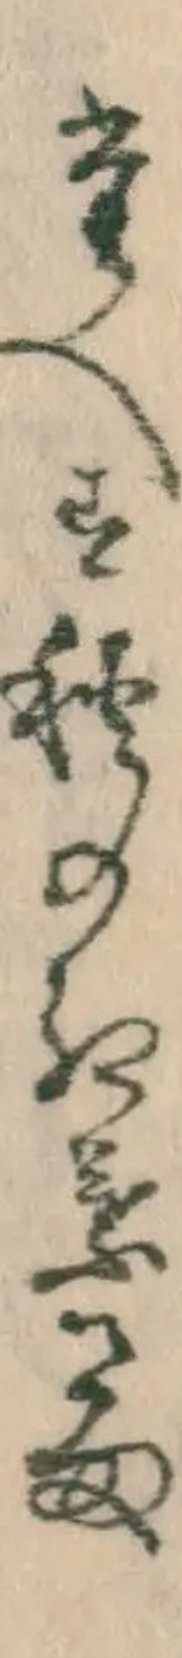たへす秋の紅葉さま
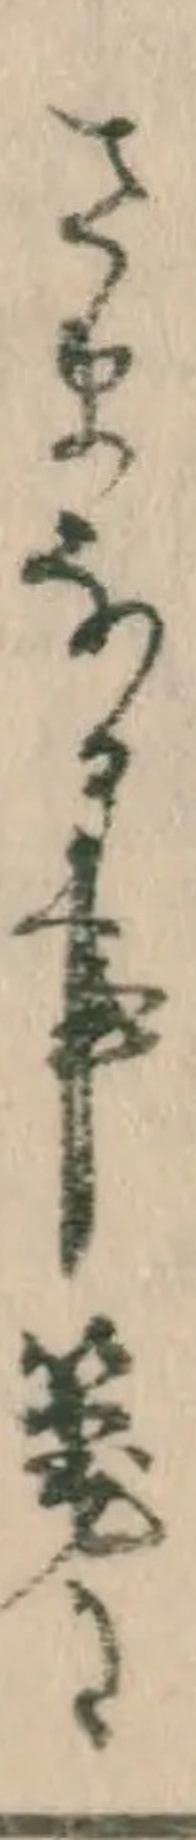さまなる事筆に
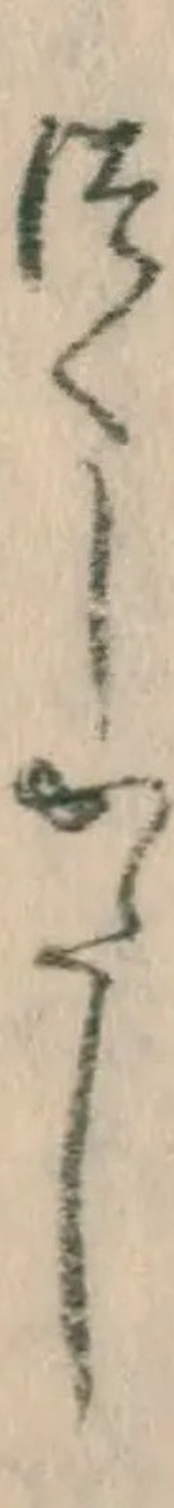つくしかたし
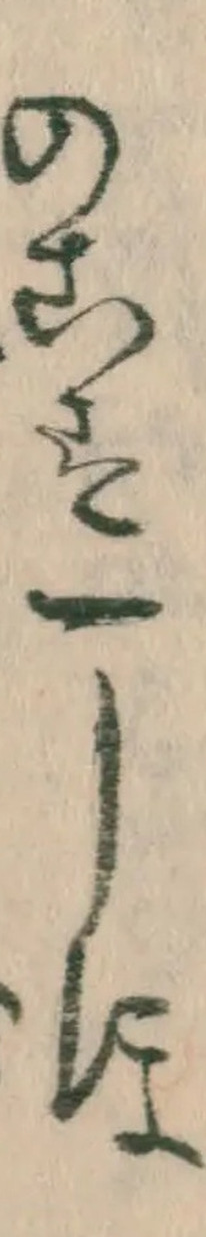のこす一しほ
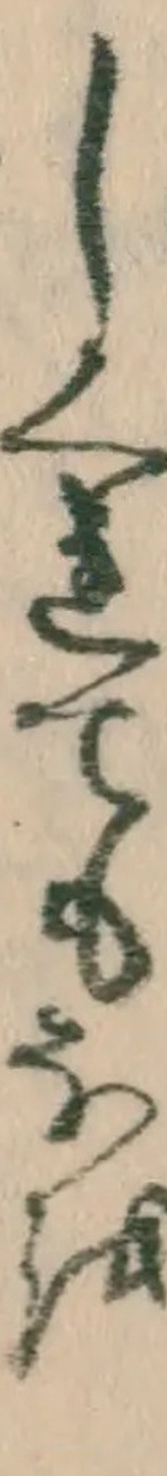しくれてもなを
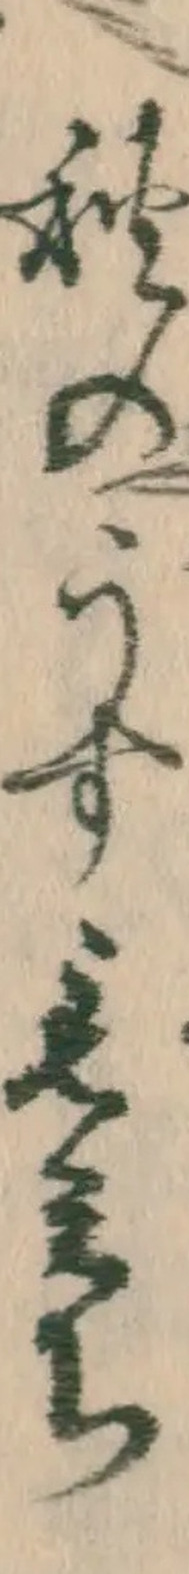秋のうすもみち
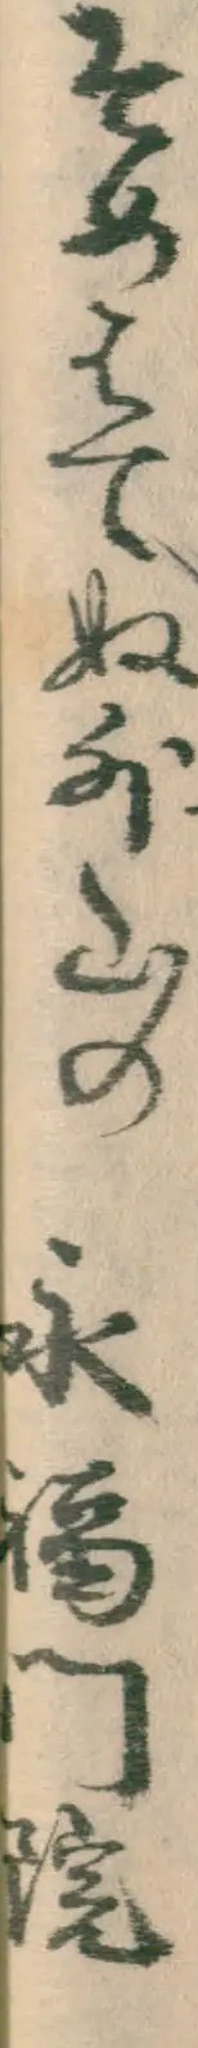そめはてぬ外山の永福門院
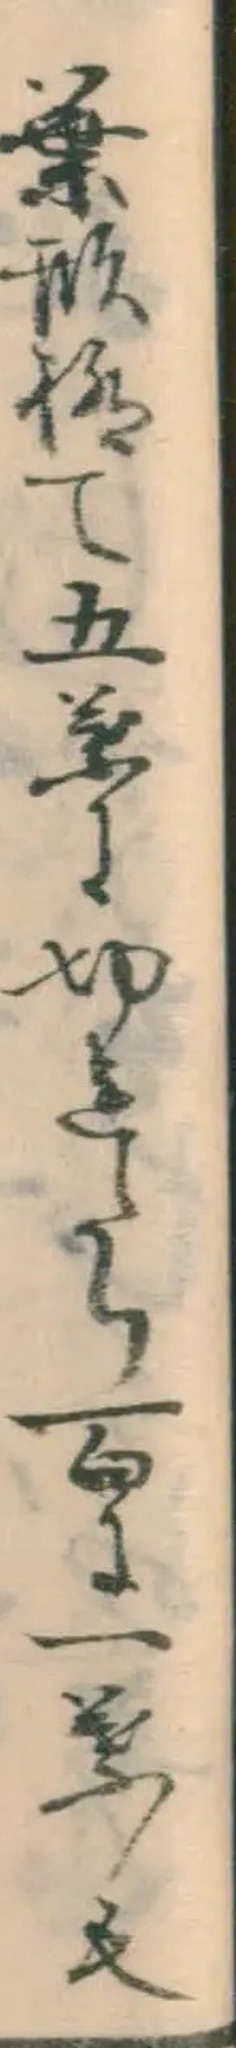隣家葉形極て五葉に切れたり百に一葉も
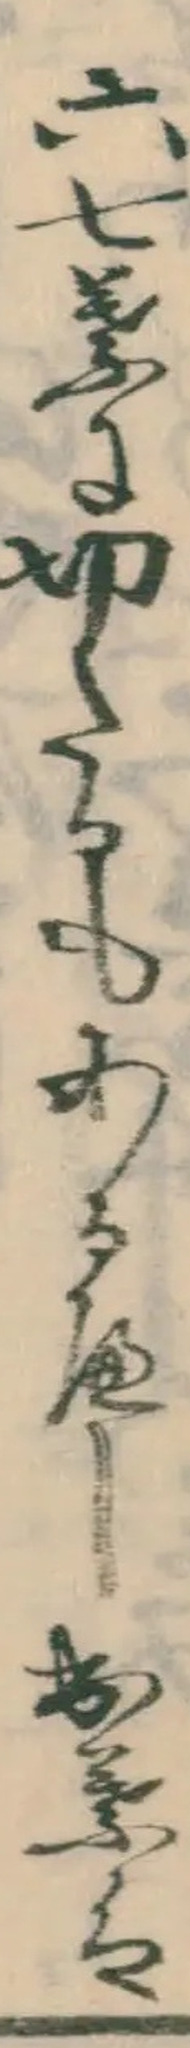六七葉に切たるもあるへし出葉は
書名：紅葉集
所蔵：国立国会図書館 National Diet Library, JAPAN
